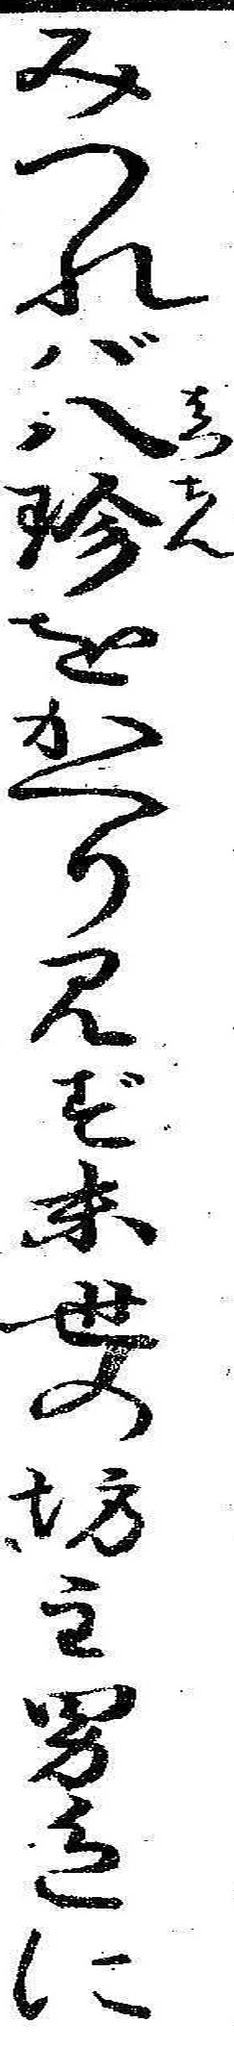みつれば八珍をかへり見ず未世の坊主男色に
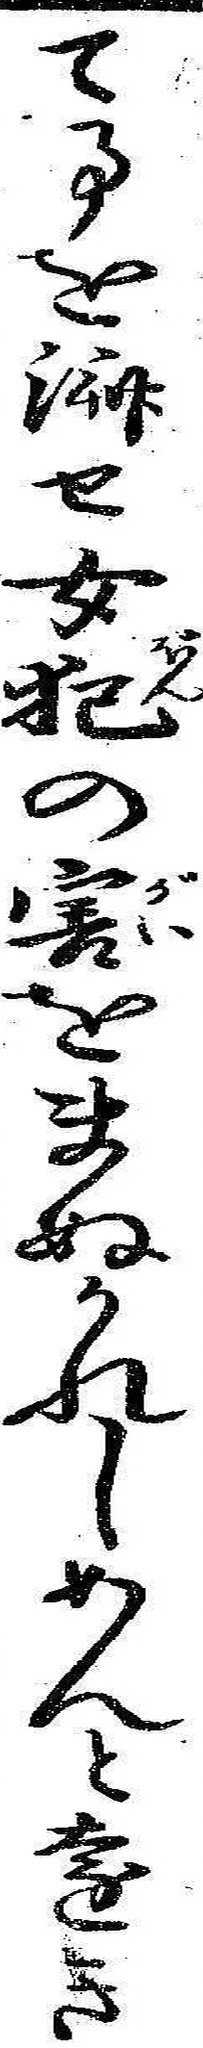て事を済せ女犯の害をまぬかれしめんと遠き
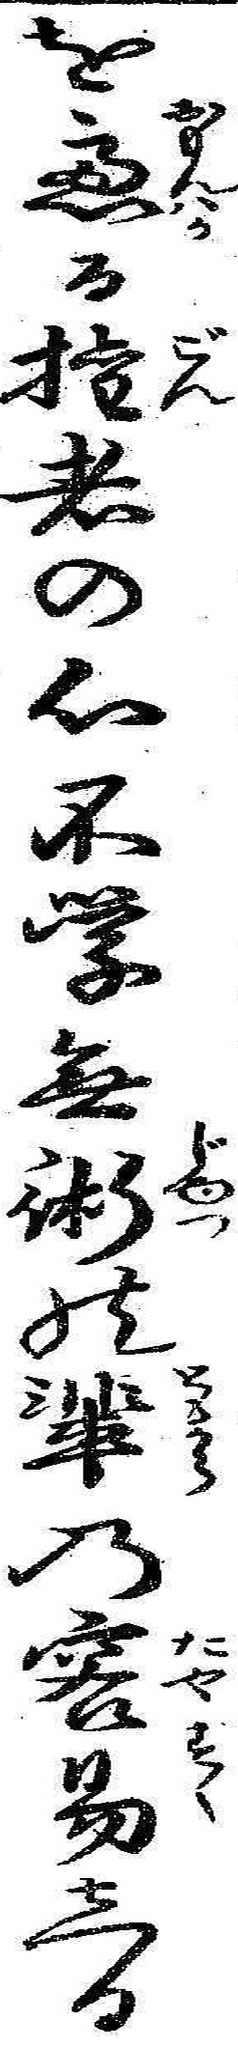を慮る権者の心不学無術の輩の容易しる
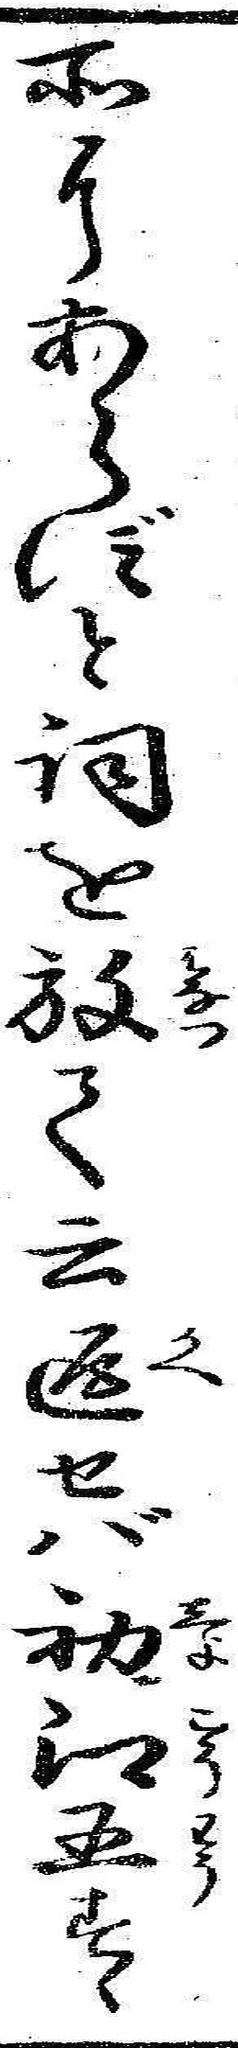所にあらずと詞を放て云返せば初江王すゝ
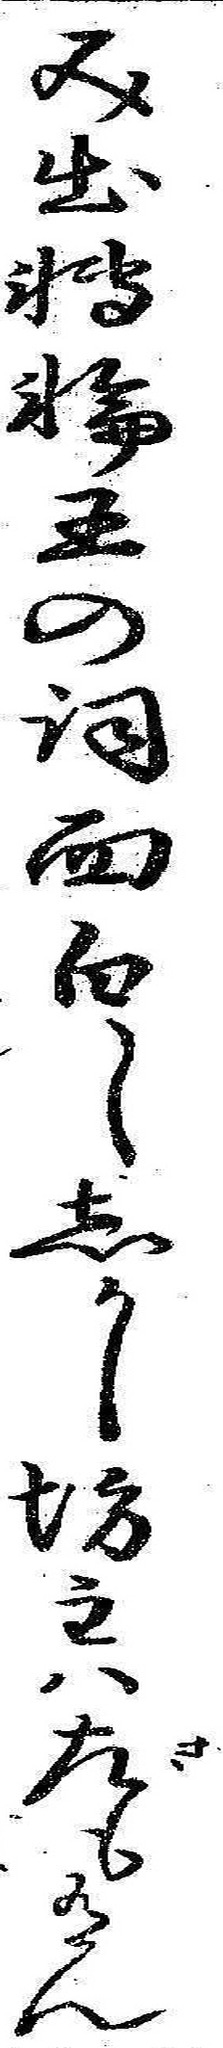み出転輪王の詞面白ししかし坊主は左も有ん
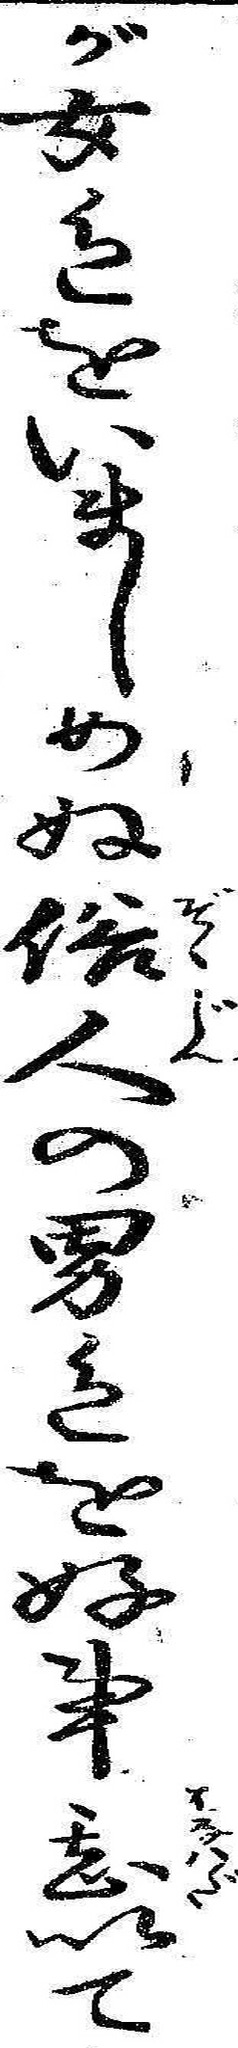が女色をいましめぬ俗人の男色を好事甚以て
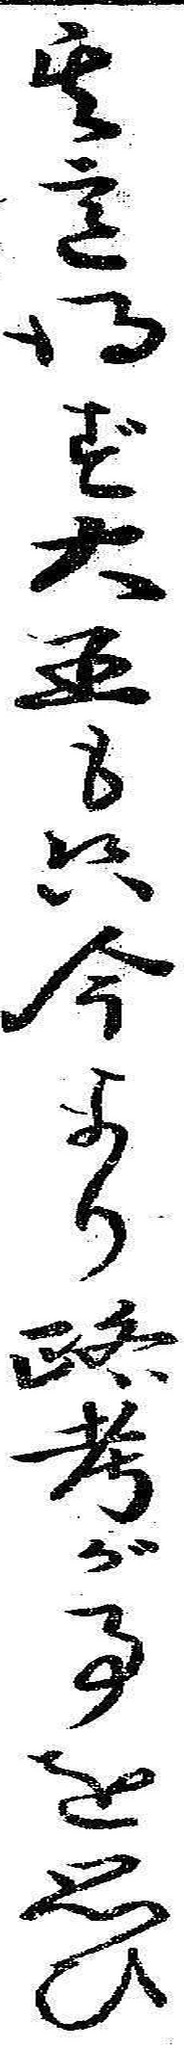其意得ず大王も只今より路考が事を思ひ
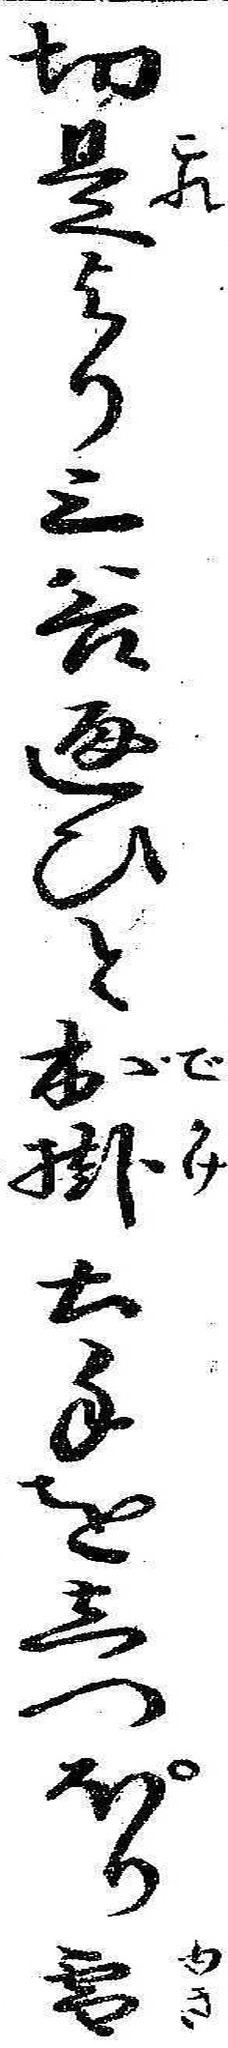切是より三谷通ひと出掛土手をしつぽり雪
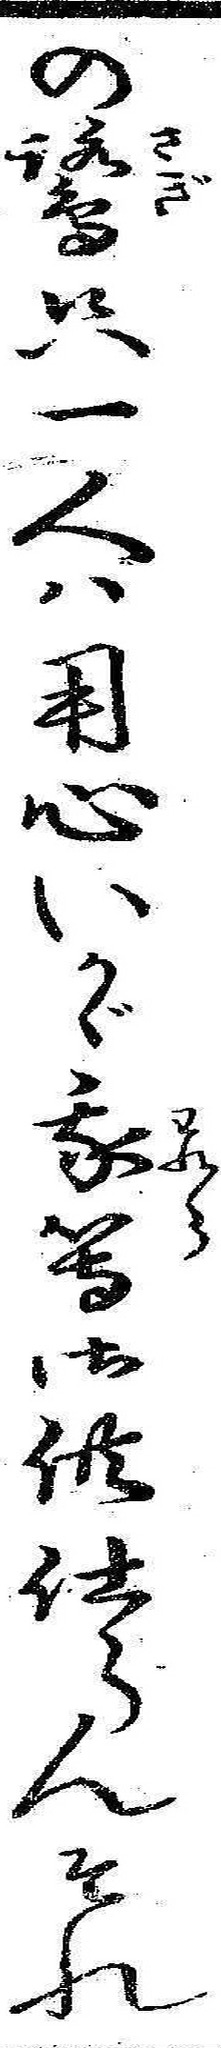の鷺只一人は用心いかゞ我等御供仕らんそれ
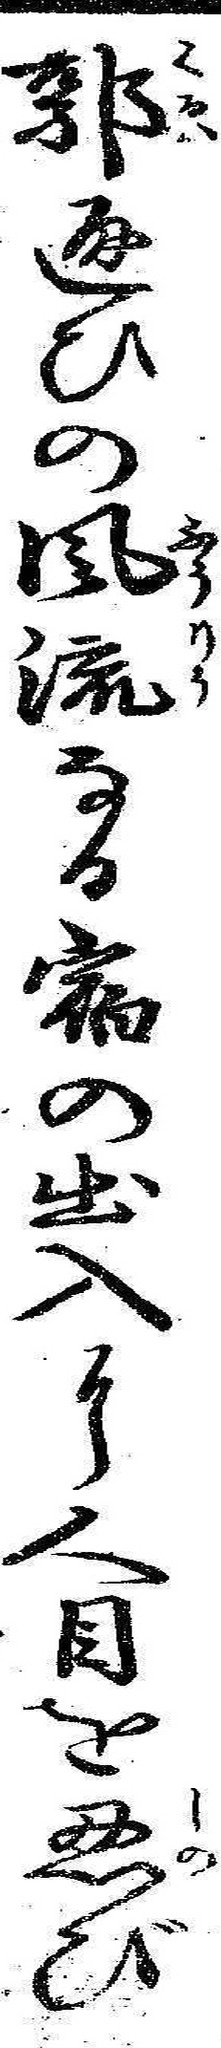郭通ひの風流なる宿の出入に人目を忍び
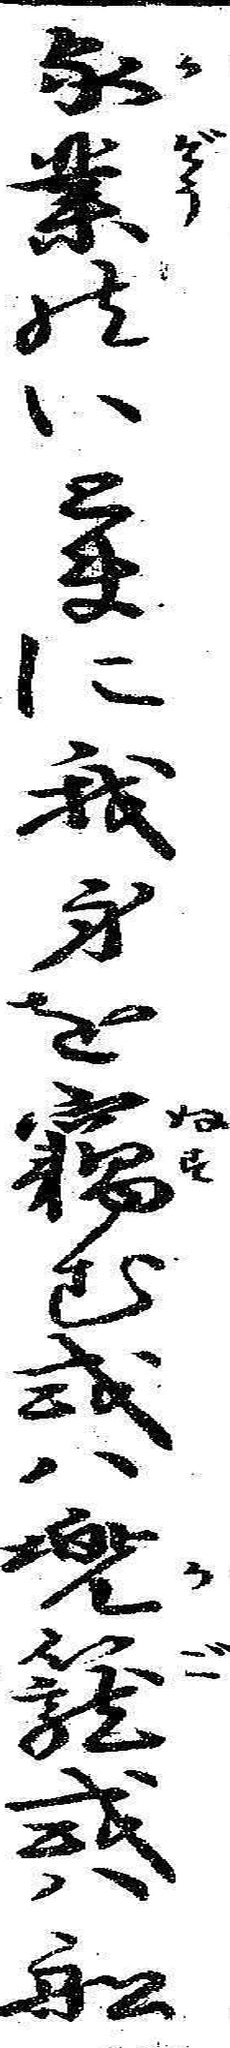家業のいとまに我身を窃む或は兜篭或は船

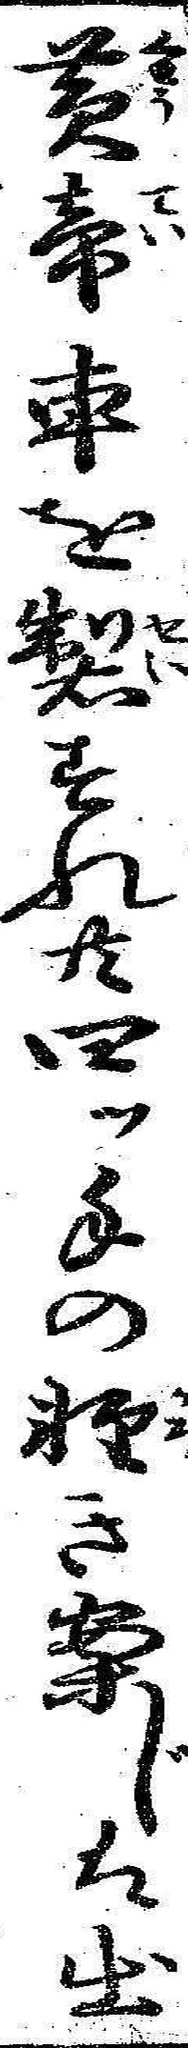黄帝車を製すれ共四ツ手の軽き案じは出
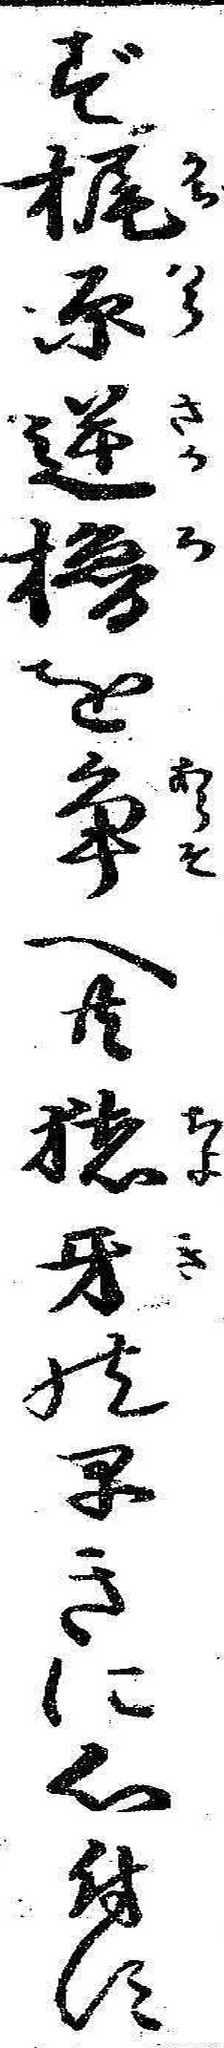ず梶原逆櫓を争へ共猪牙の早きに心付す
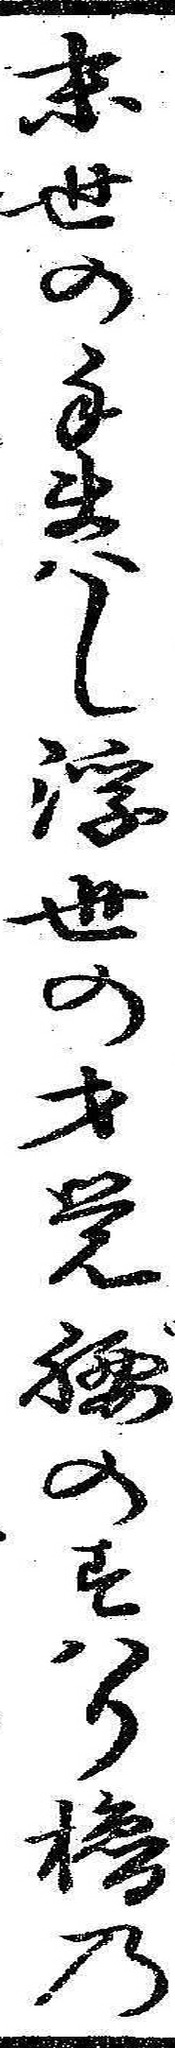末世の手まはし浮世の才覚腰のすはり櫓の
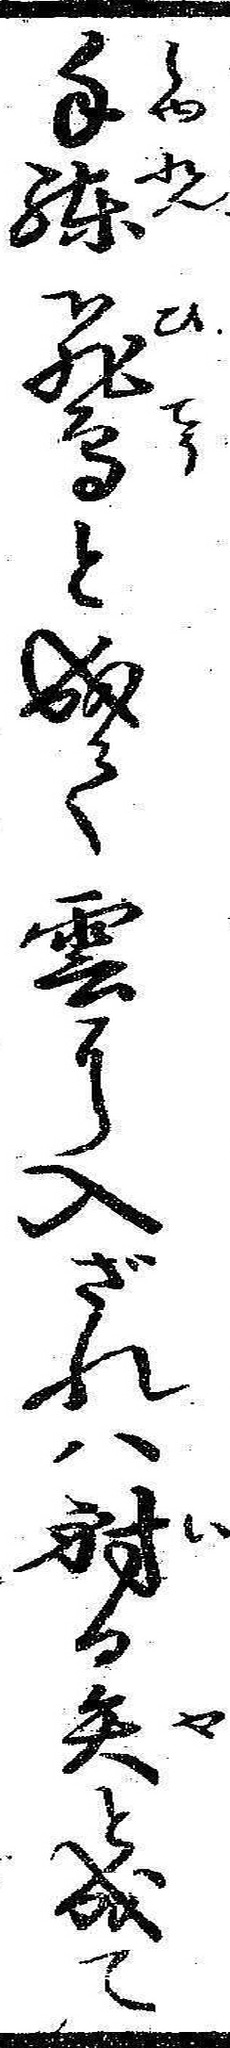手練飛鳥と成て雲に入ざれは射る矢と成て
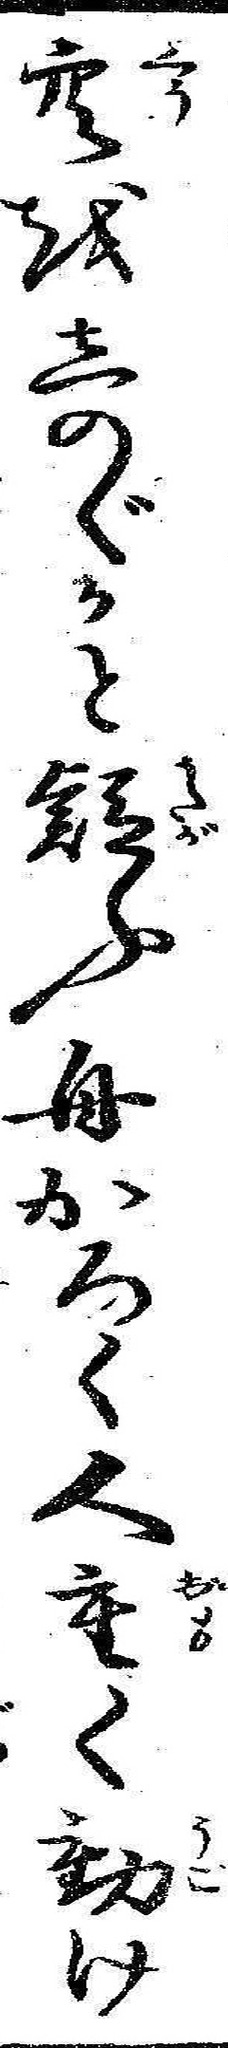空をしのぐかと疑ふ舟かろく人重く動け
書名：根無草後編
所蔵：国文学研究資料館
